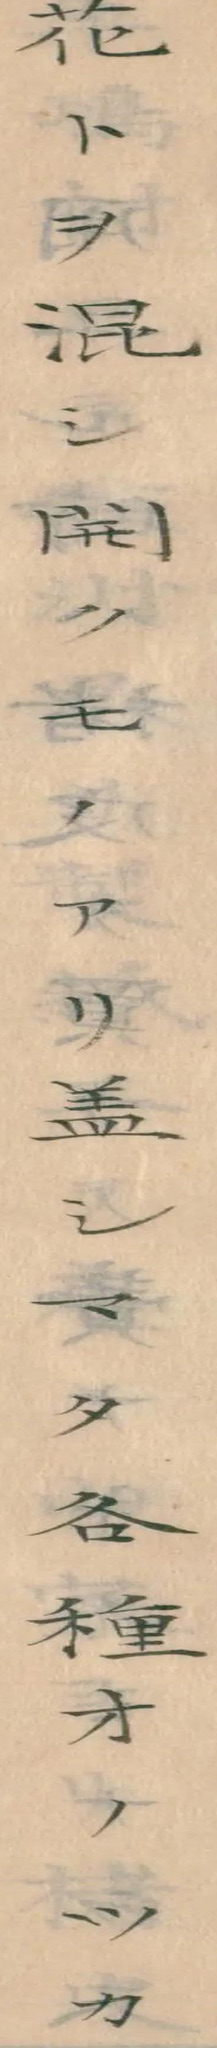花トヲ混シ開クモノアリ蓋シマタ各種オノツカ
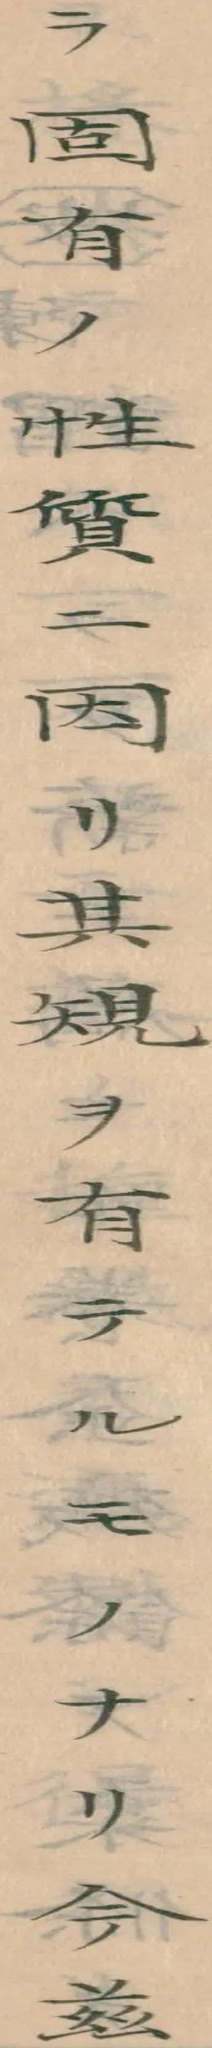ラ固有ノ性質ニ因リ其䂓ヲ有テルモノナリ今茲
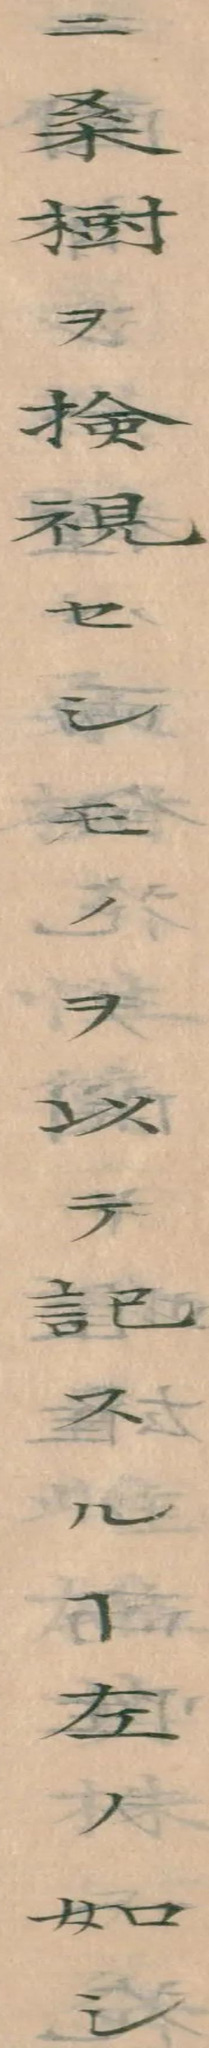ニ桑樹ヲ𢮦視セシモノヲ以テ記スルコト左ノ如シ
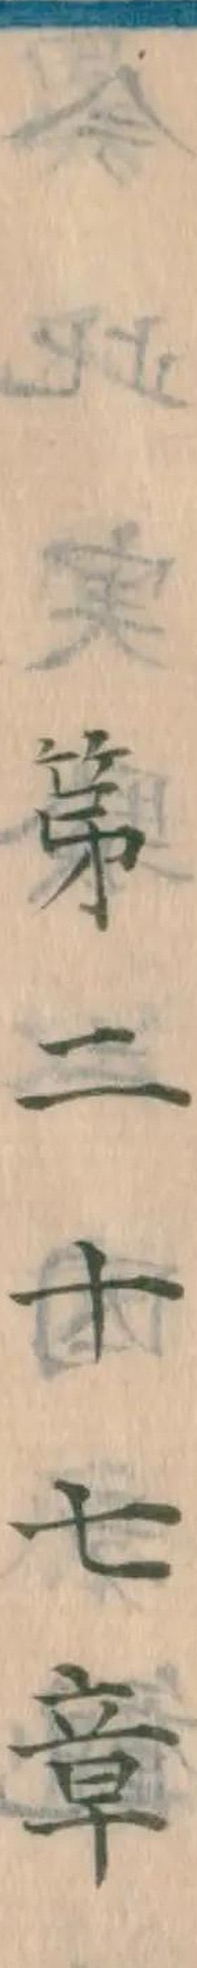第二十七章
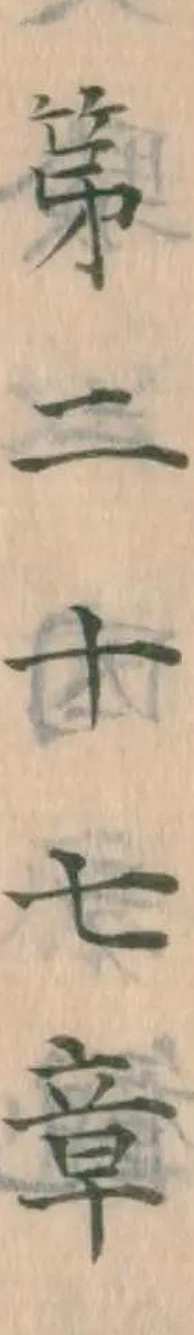第二十七章
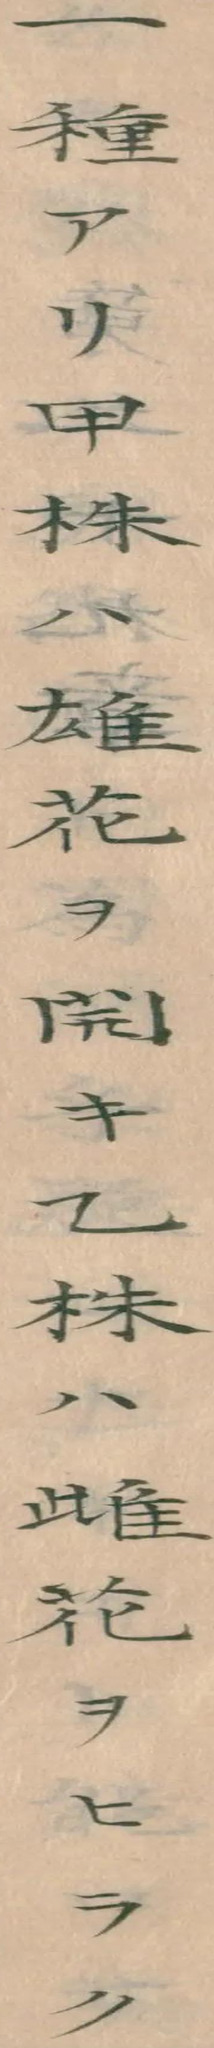一種アリ甲株ハ雄花ヲ開キ乙株ハ雌花ヲヒラク
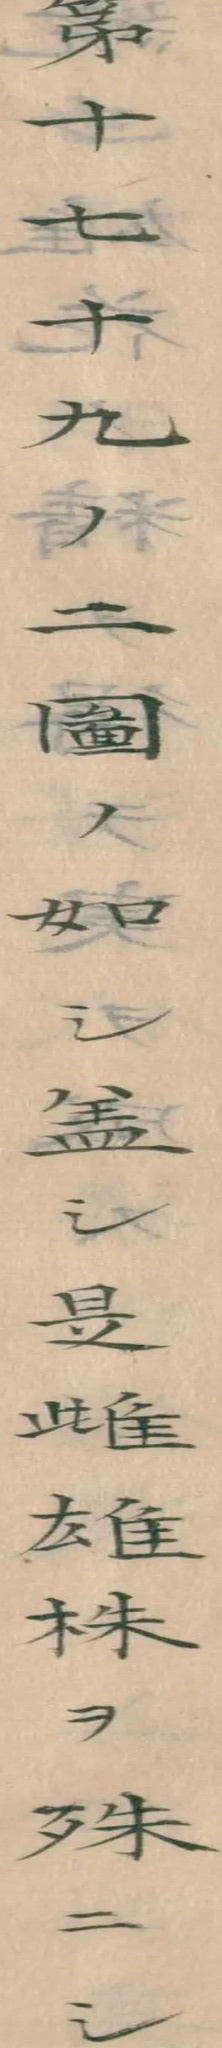第十七十九ノ二図ノ如シ蓋シ是雌雄株ヲ殊ニシ
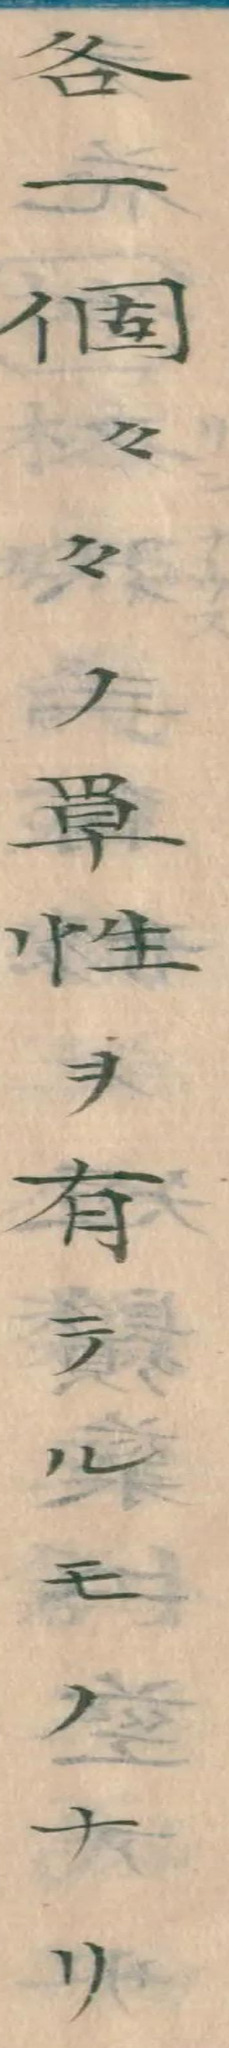各一個々々ノ単性ヲ有テルモノナリ
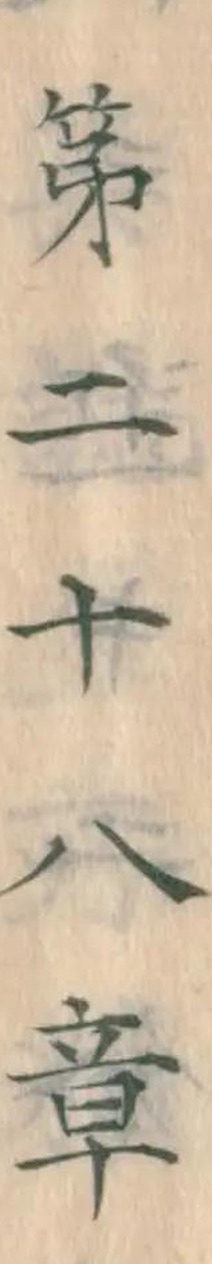第二十八章
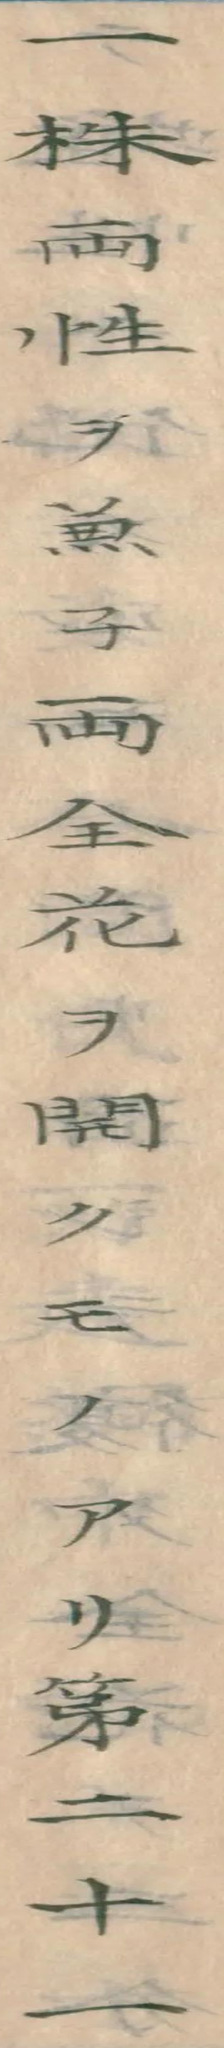一株両性ヲ兼ネ両全花ヲ開クモノアリ第二十一
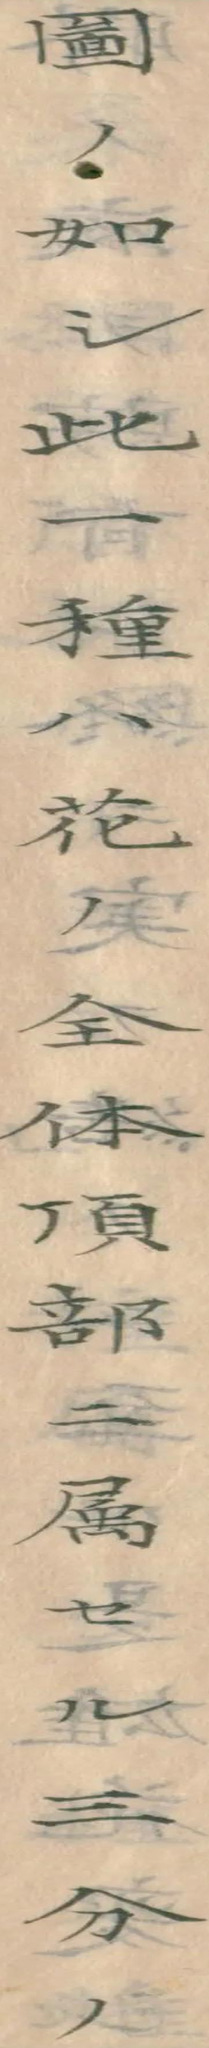図ノ如シ此一種ハ花ノ全体頂部ニ属セル三分ノ
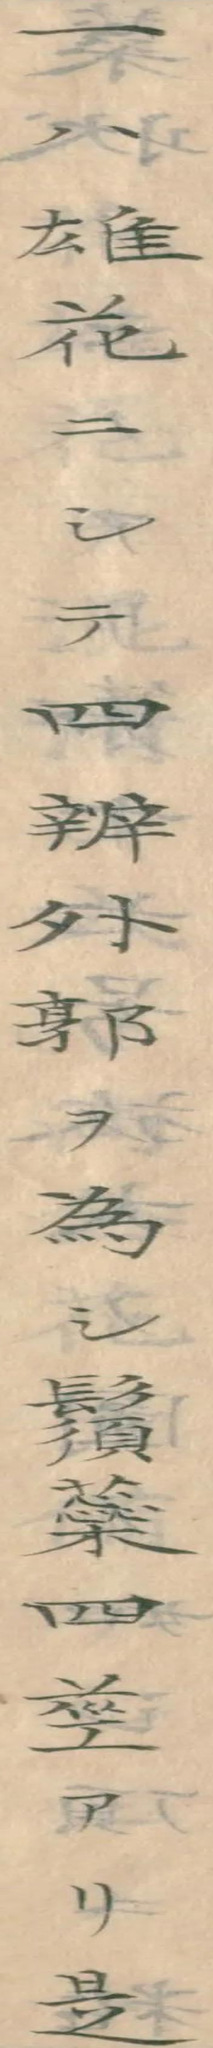一ハ雄花ニシテ四弁外郭ヲ為シ鬚蘂四茎アリ是
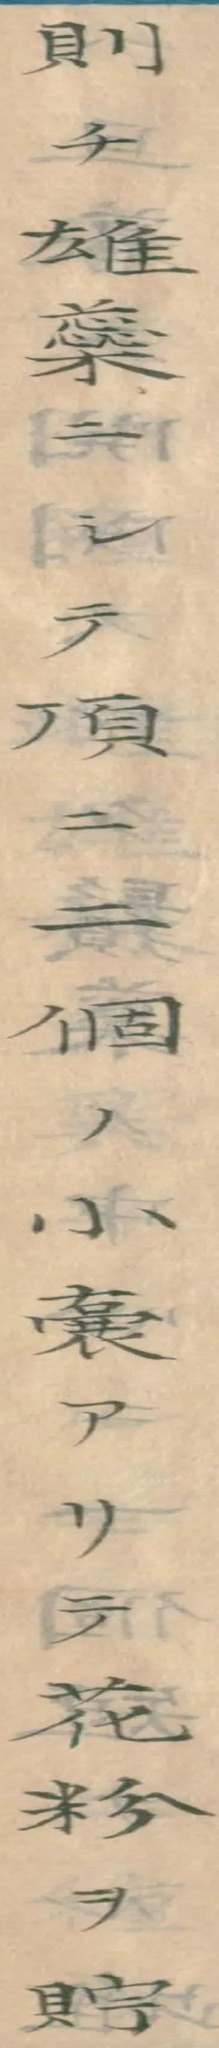則チ雄蘂ニシテ頂ニ二個ノ小嚢アリテ花粉ヲ貯

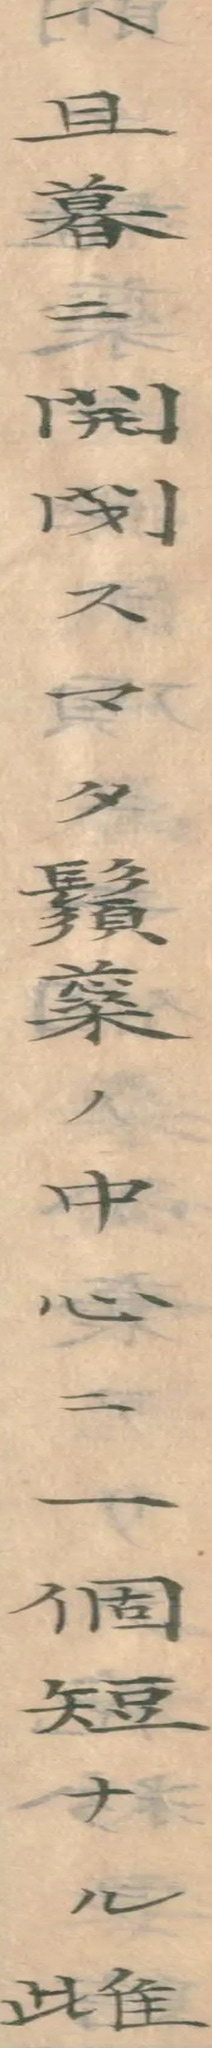ヘ且暮ニ開閉スマタ鬚蘂ノ中心ニ一個短ナル雌
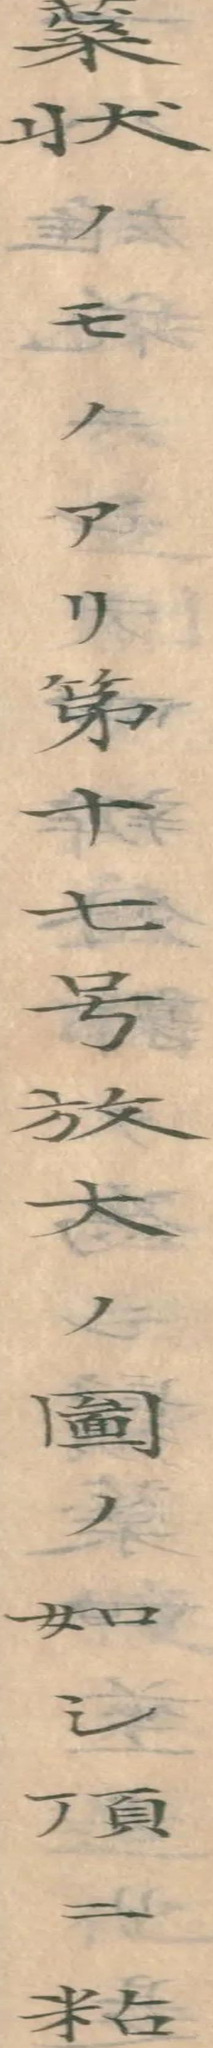蘂状ノモノアリ第十七号放大ノ図ノ如シ頂ニ粘
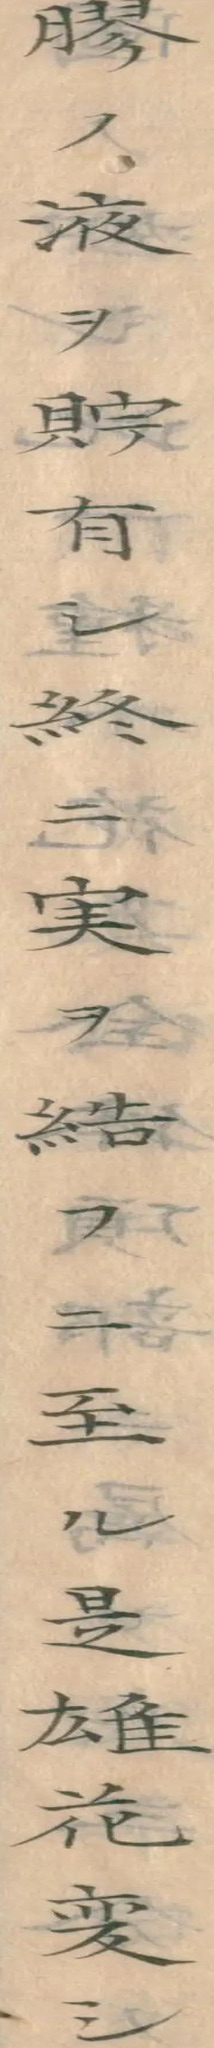膠ノ液ヲ貯有シ終ニ実ヲ結フニ至ル是雄花変シ
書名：蚕桑集成
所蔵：国立国会図書館 National Diet Library, JAPAN
